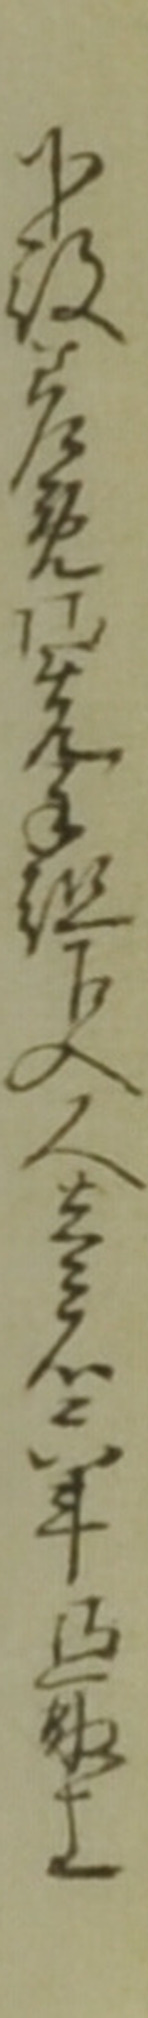下役差免御先手組江入人壱石六斗御取上
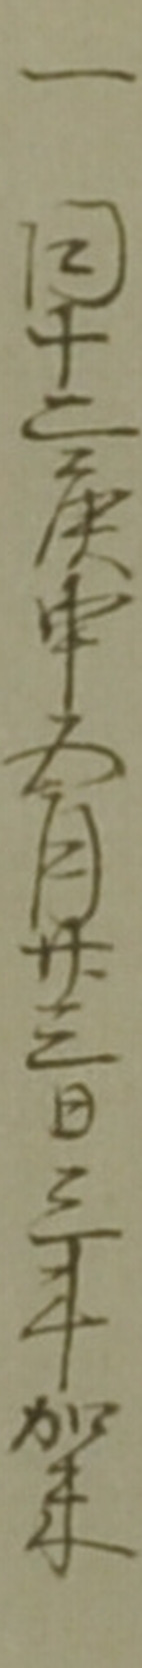一同十二庚申五月廿三日三斗加米
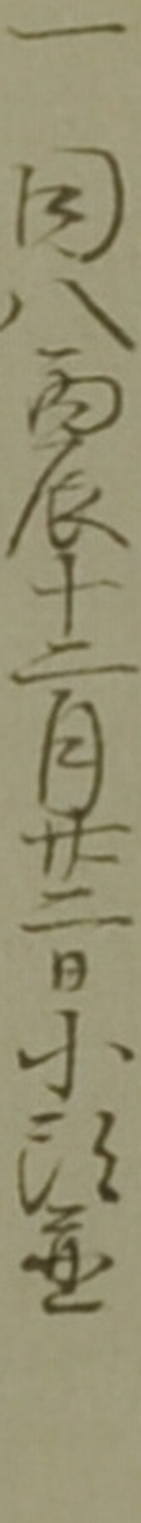一同八丙辰十二月廿二日小頭並
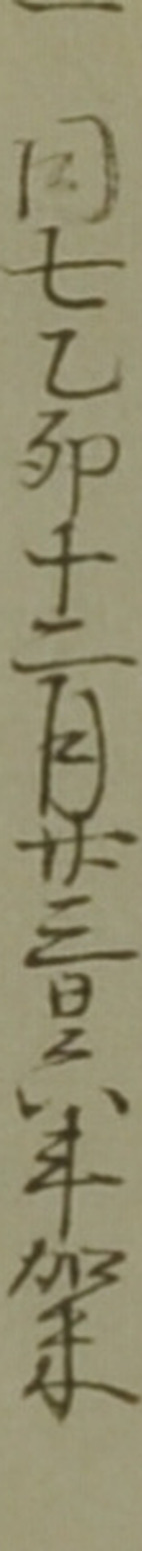一同七乙卯十二月廿三日六斗加米
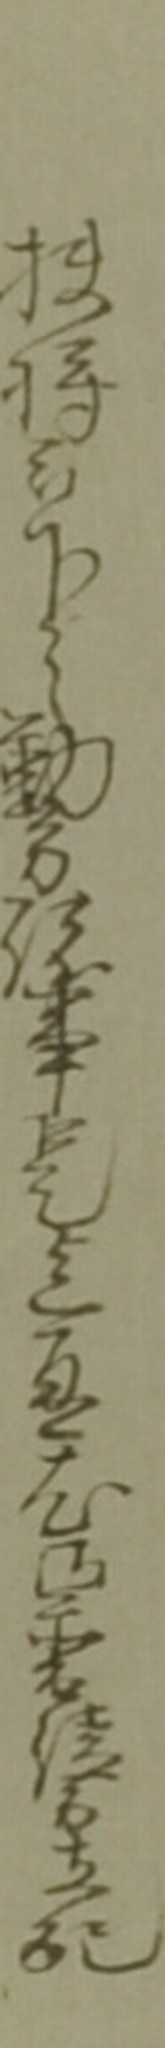扶持被下之勤方諸事是迄通尤御普請方支配
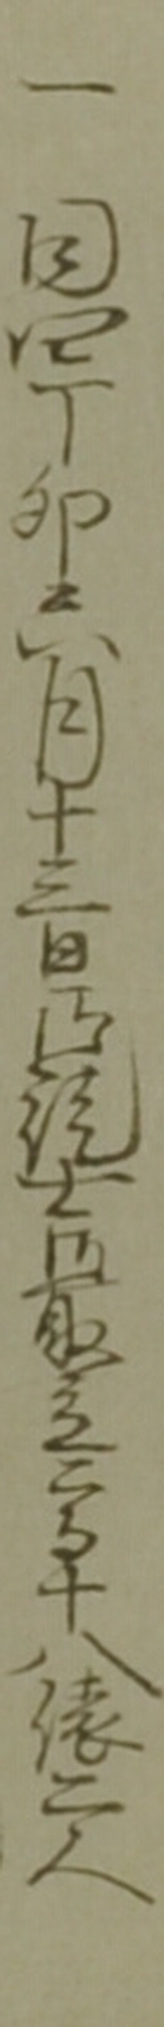一同四丁卯六月十三日御徒士御取立高十八俵二人
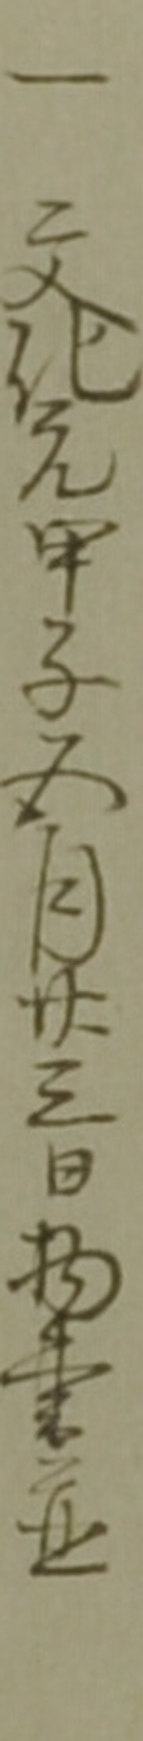一文化元甲子五月廿三日物書並
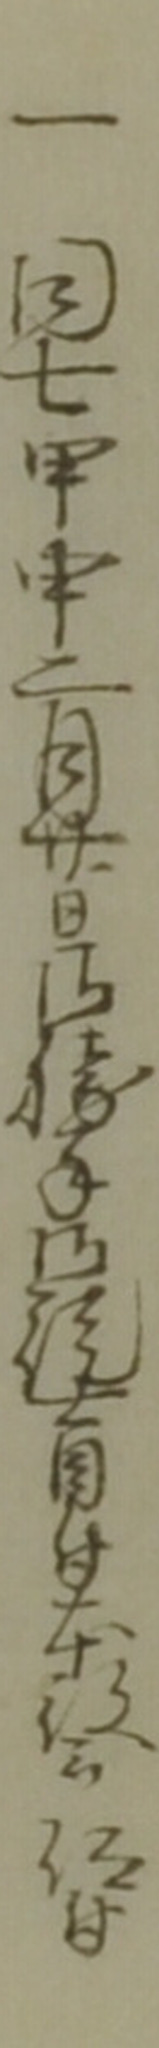一同七甲申二月廿日御勝手御徒士目付本役被仰付
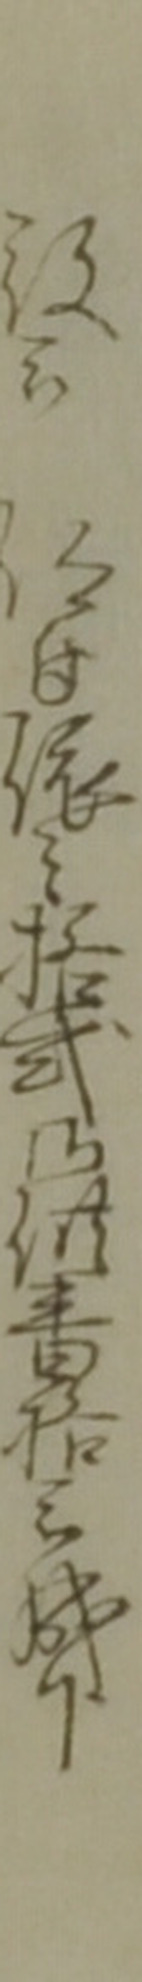役被仰付依之格式御供番格被成下
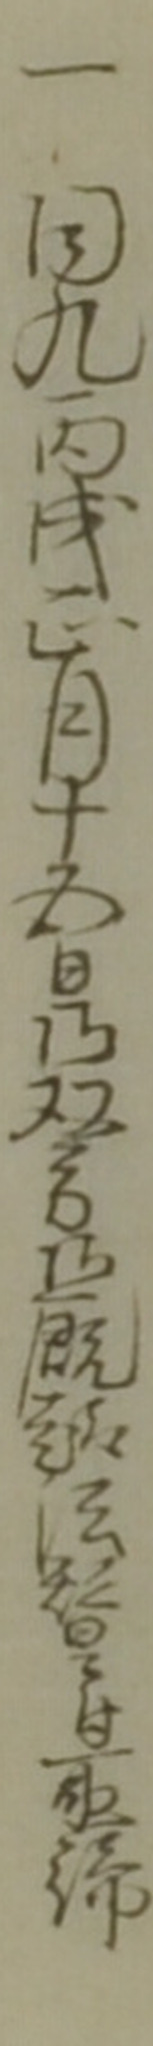一同九丙戌正月十五日御双方御厩趣法替ニ付取締
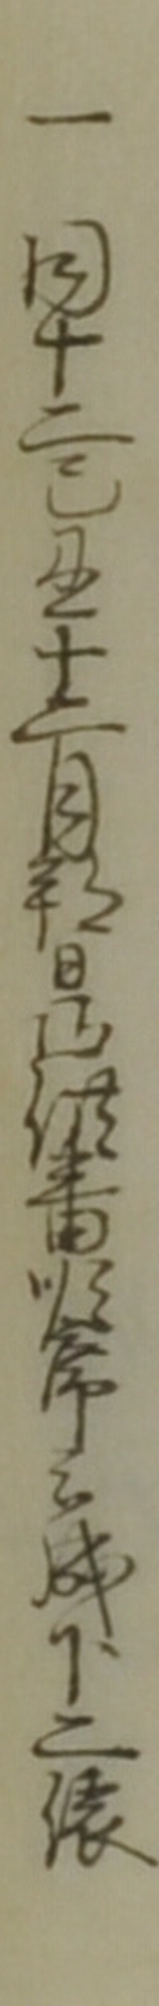一同十二己丑十二月朔日御供番順席被成下二俵
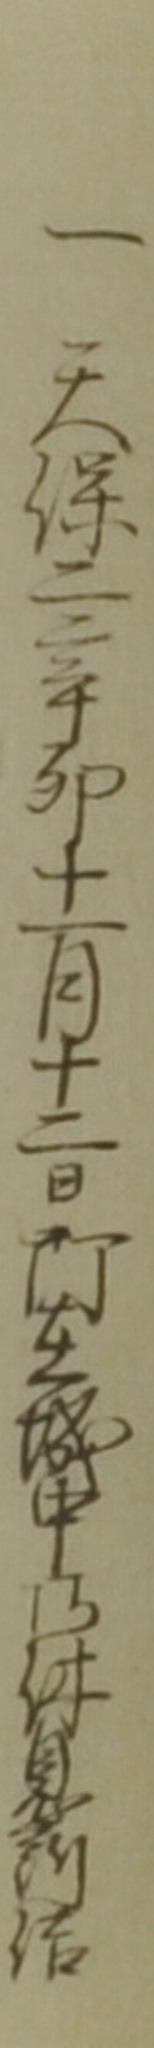一天保二辛卯十一月十二月御在城御休息所詰
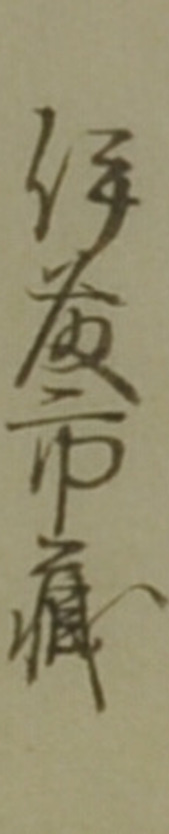伊藤市蔵

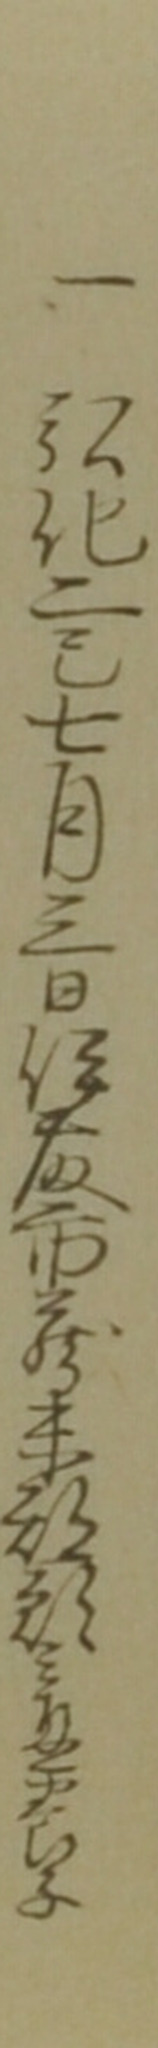一弘化二巳七月三日伊藤市蔵末期願之通養子
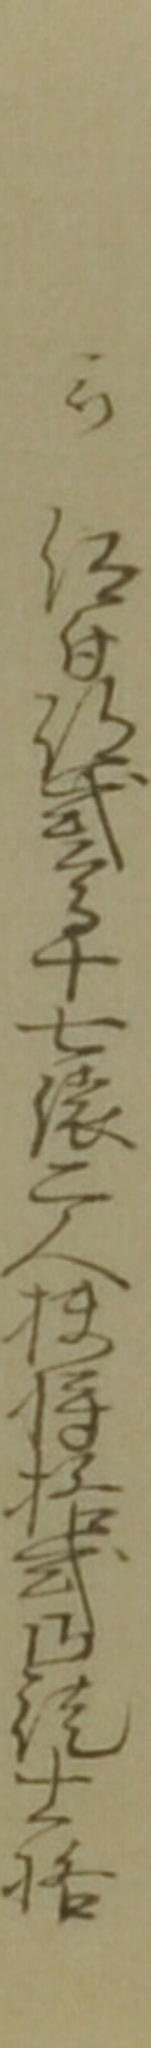被仰付跡式十七俵二人扶持格式御徒士格
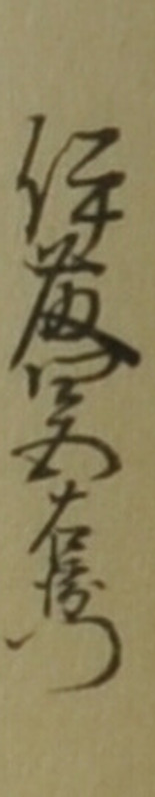伊藤四五右衛門
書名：無足諸士勤仕録（七）
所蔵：伊那市立高遠町図書館・合同会社AMANE
